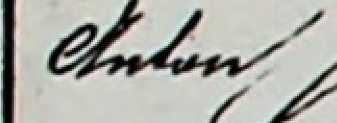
Anton
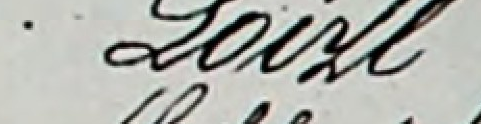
Loizl
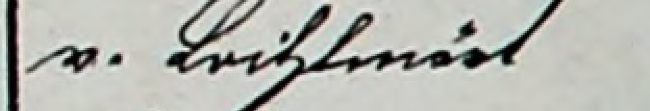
v. :Leitztmört
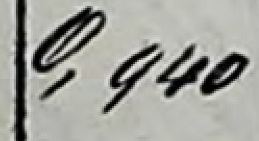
0,940
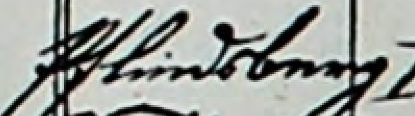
Pflindsberg
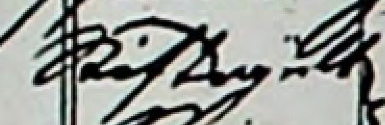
Stiftsgült
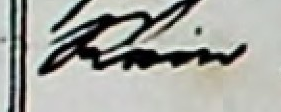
Rein
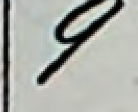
9
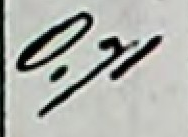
0,71
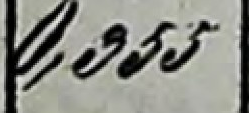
0,355
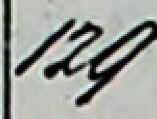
129
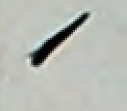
1
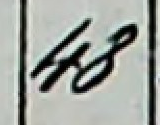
48
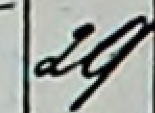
29
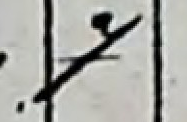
7
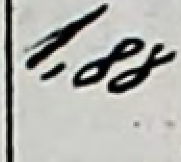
1,88
